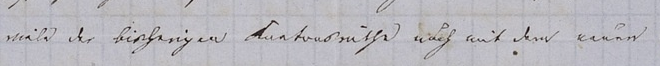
viele der bisherigen Kantonsräthe auch mit dem neuen
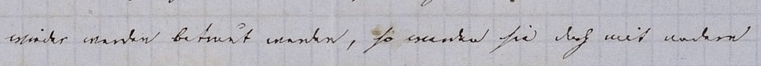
wieder werden betraut werden, so werden sie doch mit andern
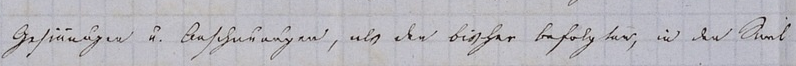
Gesinnungen u. Anschauungen, als den bisher befolgten, in den Saal
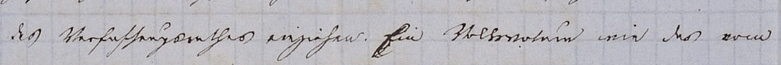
des Verfassungsrathes einziehen. Ein Volksvotum wie das vom
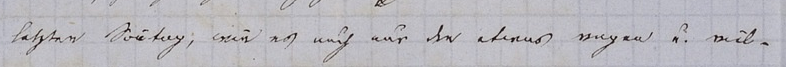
letzten Sonntag; wenn es auch nur den etwas vagen u. viel-
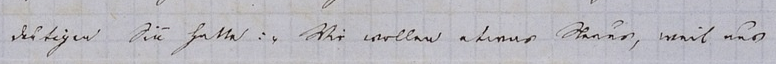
deutigen Sinn hatte: «Wir wollen etwas Neues, weil uns
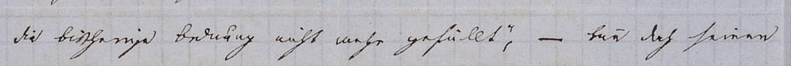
die bisherige Ordnung nicht mehr gefällt», – kann doch seinen
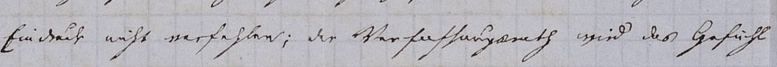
Eindruck nicht verfehlen; der Verfassungsrath wird das Gefühl
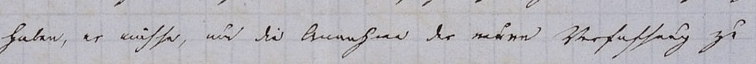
haben, er müsse, um die Annahme der neuen Verfassung zu
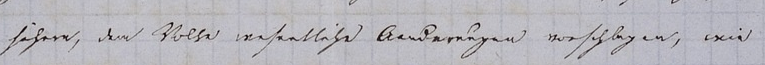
sichern, dem Volke wesentliche Aenderungen vorschlagen, wie
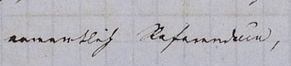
namentlich Referendum,
